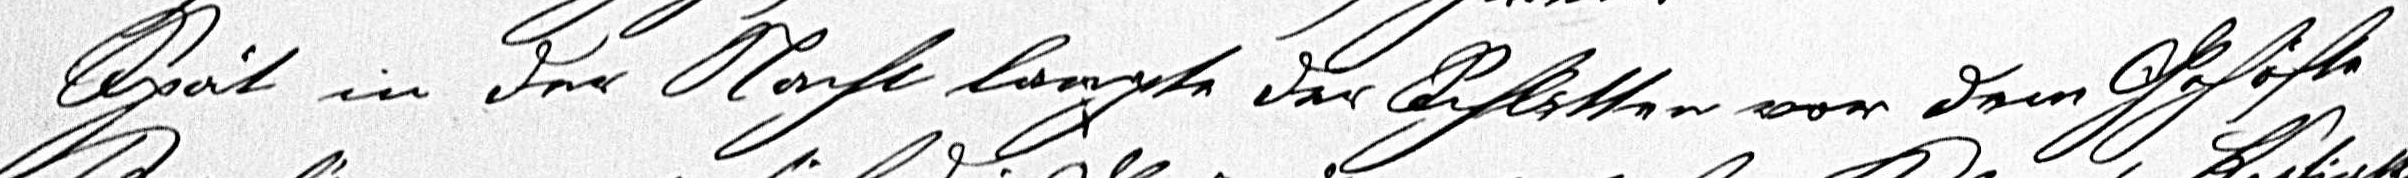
Spät in der Nacht langte der Schlitten vor dem Gehöfte
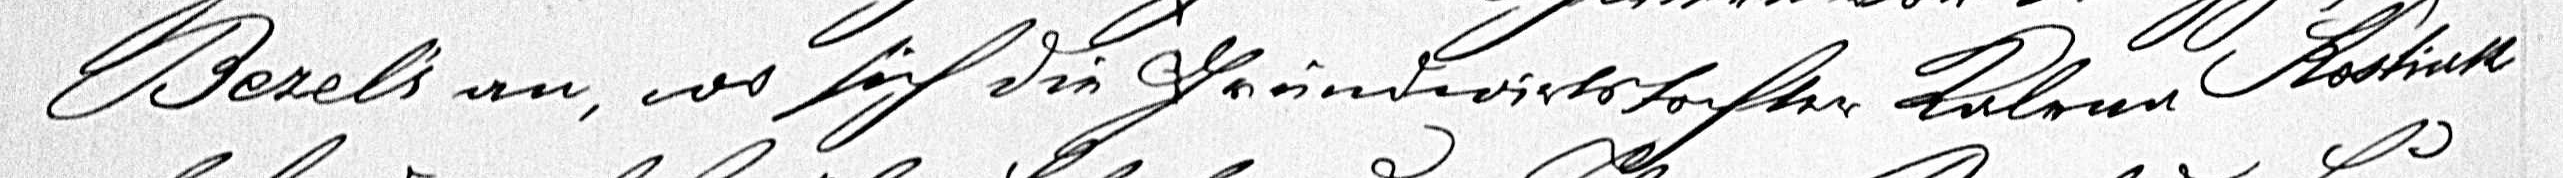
Bezel’s an, wo sich die Grundwirthstochter Kalene Kostiuk
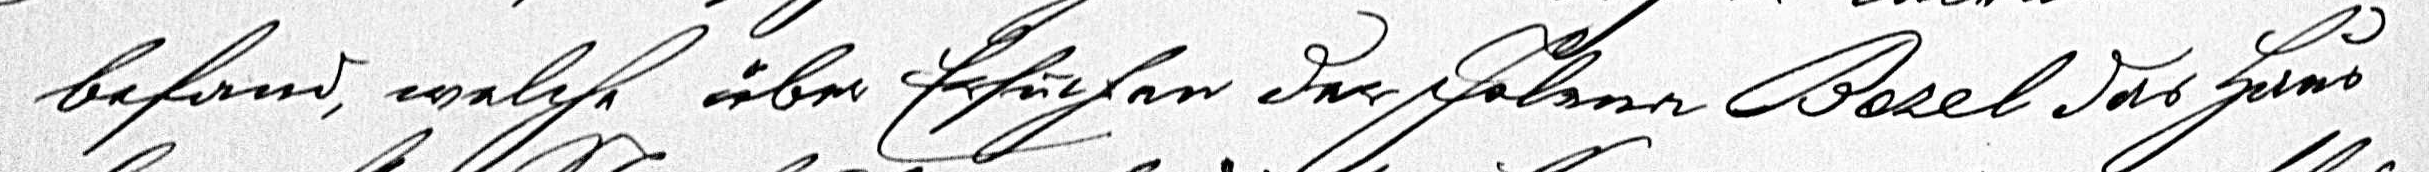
befand, welche über Ersuchen der Jelena Bezel das Haus
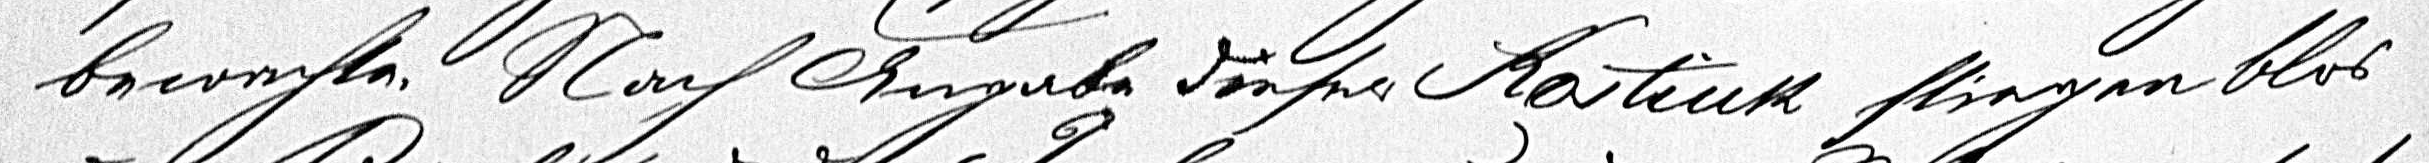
bewachte. Nach Angabe dieser Kostiuk stiegen blos
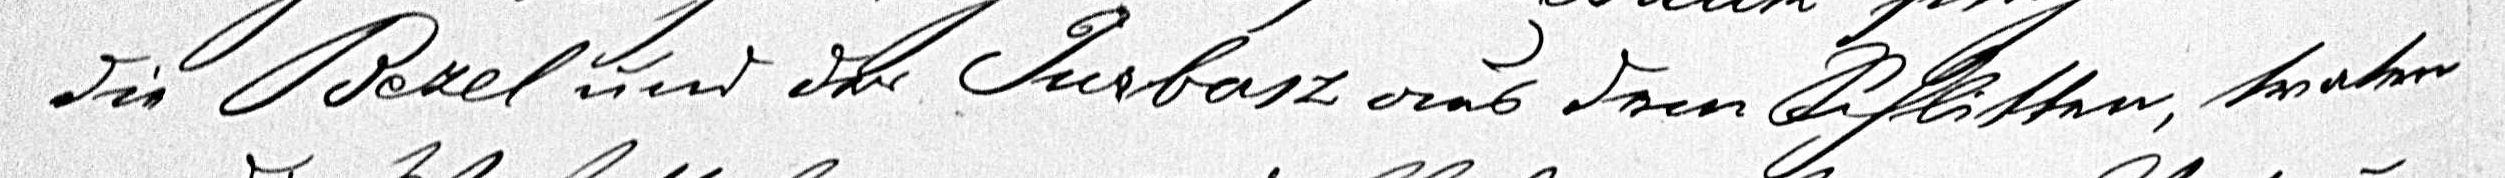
die Bezel und der Iurbasz aus dem Schlitten, traten
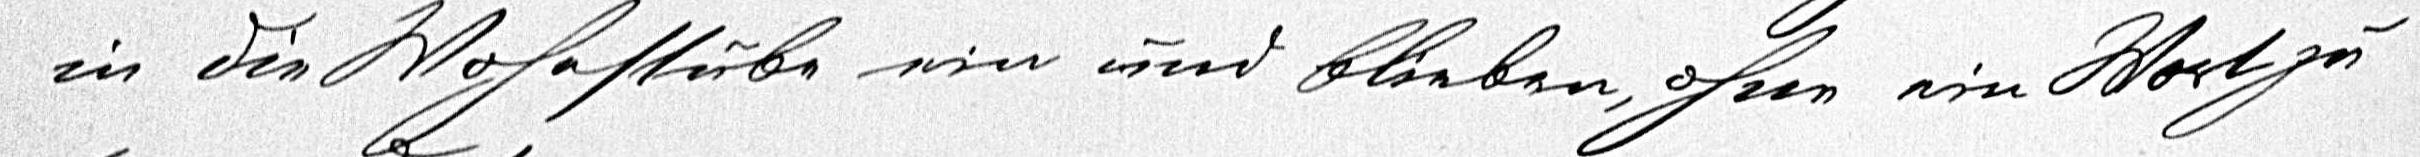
in die Wohnstube ein und blieben, ohne ein Wort zu
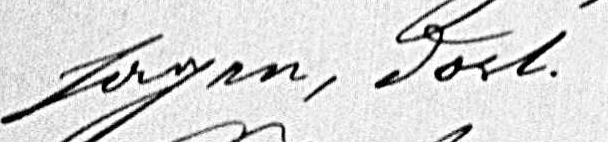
sagen, dort.
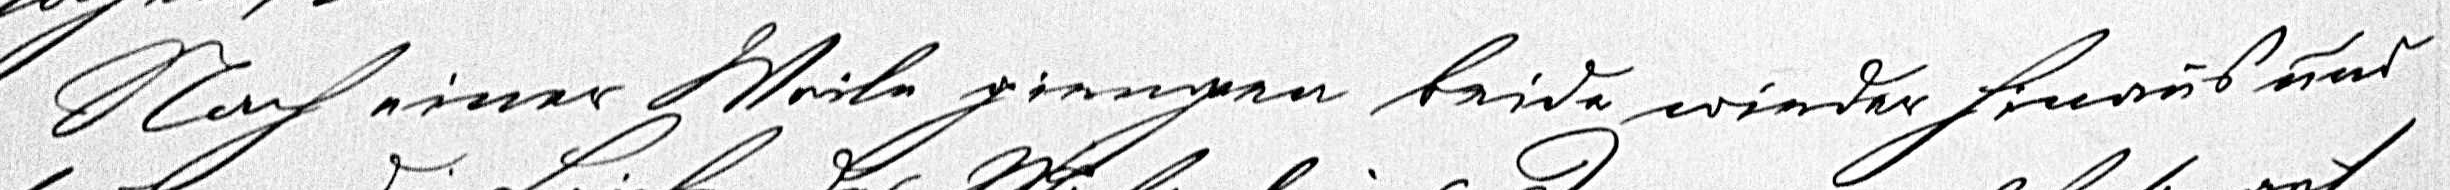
Nach einer Weile giengen beide wieder hinaus und
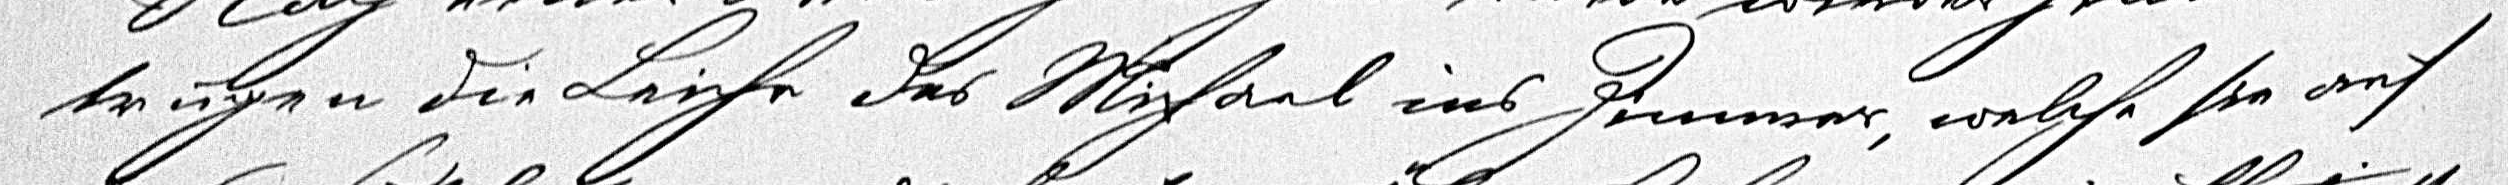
trugen die Leiche des Michael ins Zimmer, welche sie auf
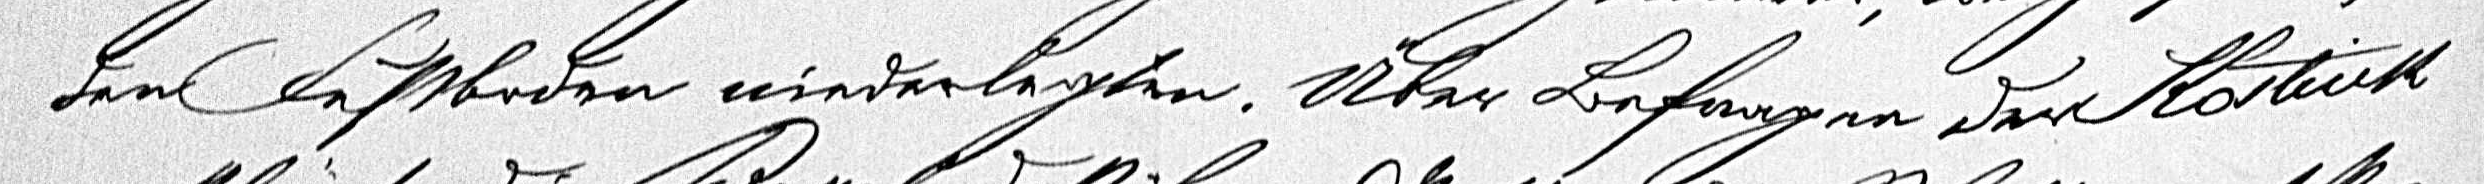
den Fußboden wiederlegten. Über Befragen der Kostiuk
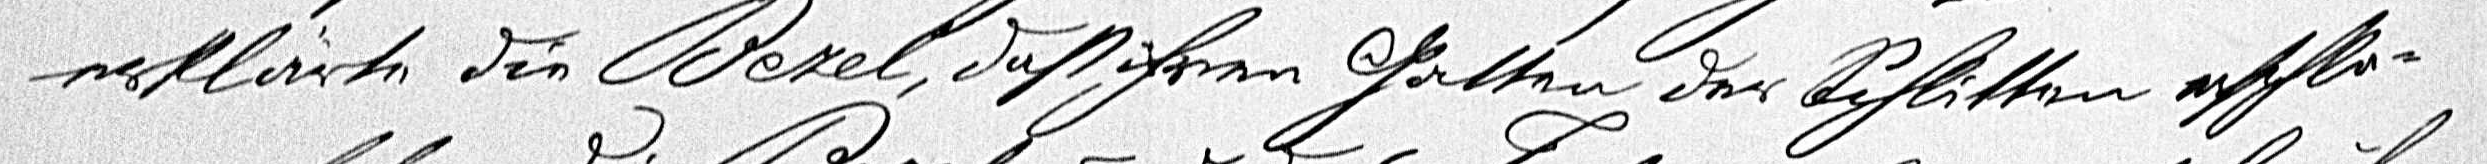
erklärte die Bezel, daß ihren Gatten der Schlitten erschla¬
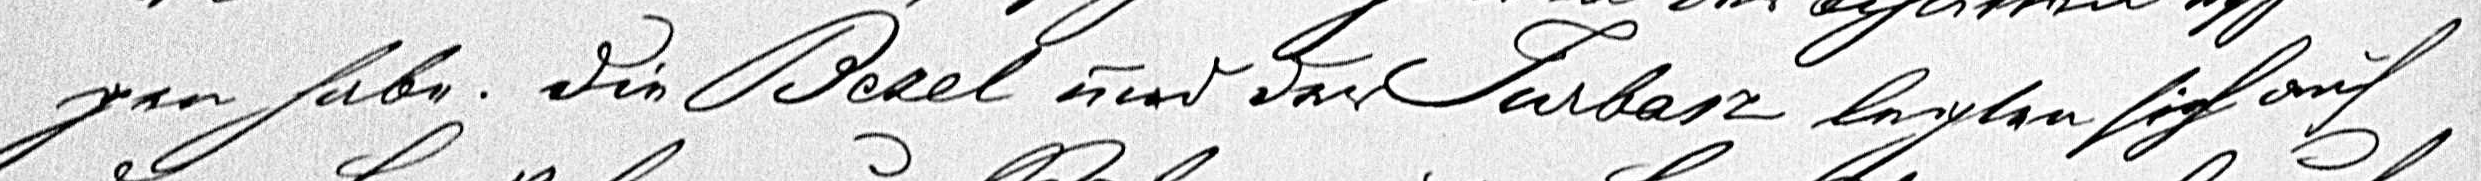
gen habe. Die Bezel und der Iurbasz legten sich auf
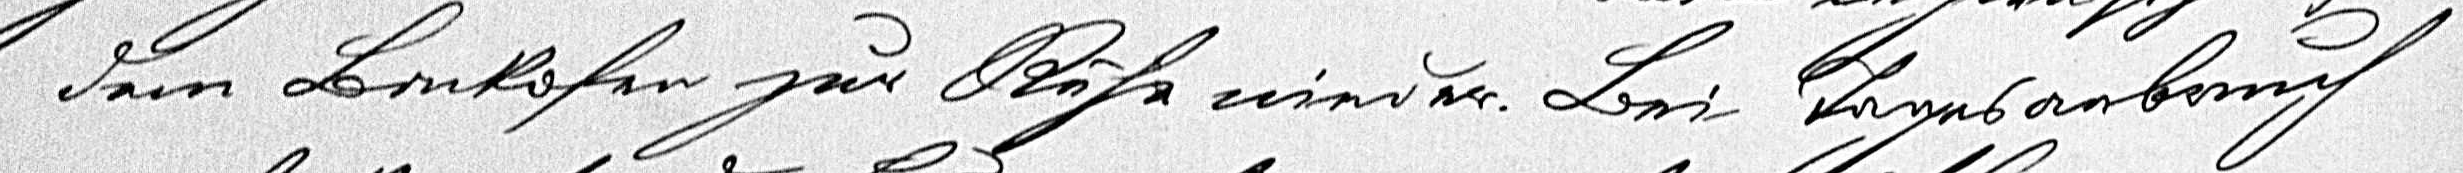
dem Bankofen zur Ruhe wieder. Bei Tagesanbruch
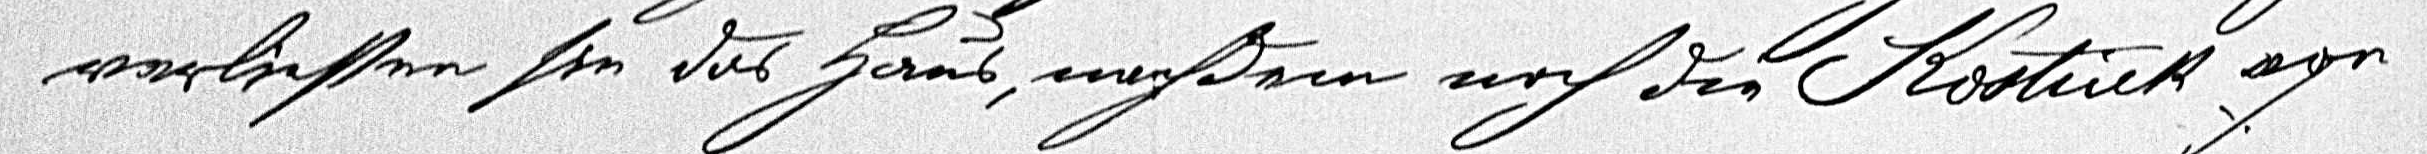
verließ sie das Haus, nachdem noch die Kostiuk von
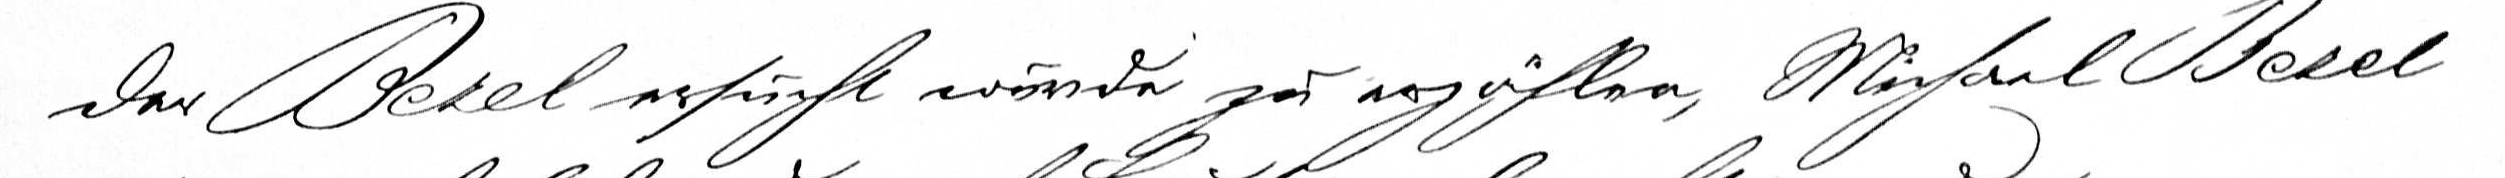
der Bezel ersucht wurde zu erzählen, Michael Bezel
